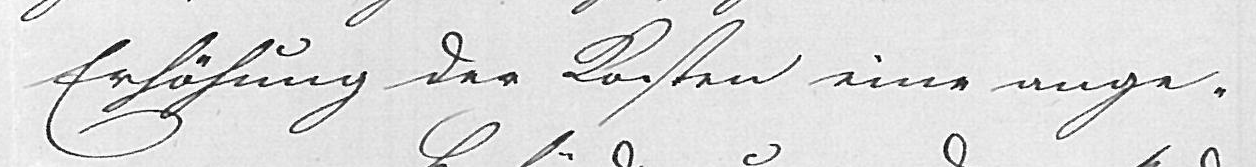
Erhöhung der Kosten eine ange-
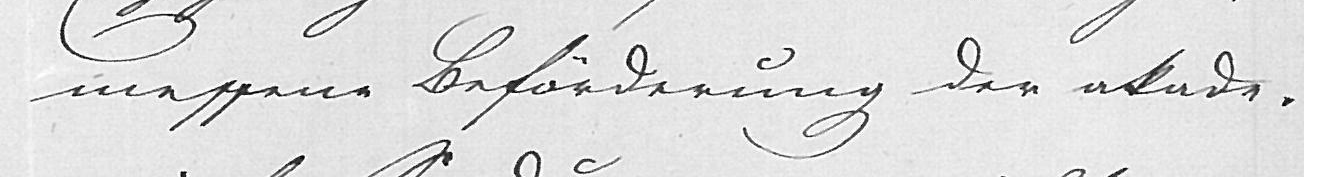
messene Beförderung der akade-
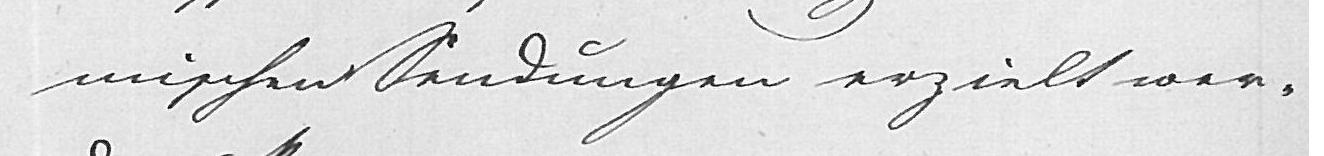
mischen Sendungen erzielt wer-
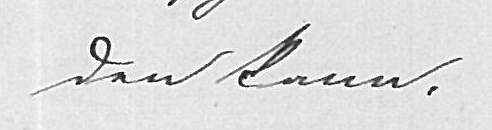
den kann.
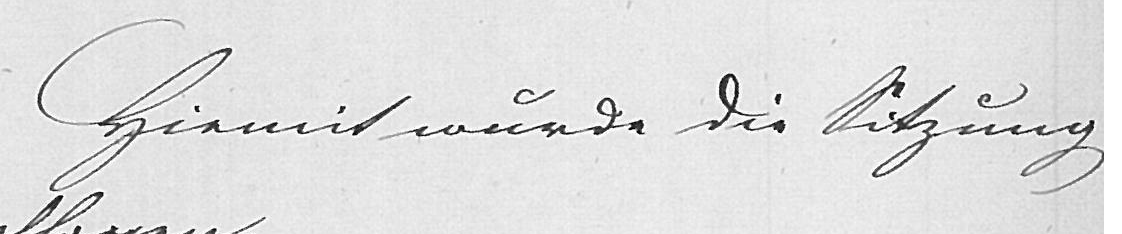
Hiemit wurde die Sitzung
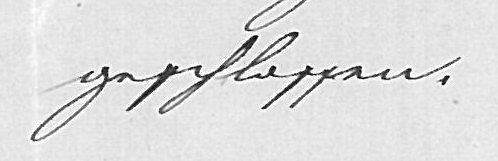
geschlossen.
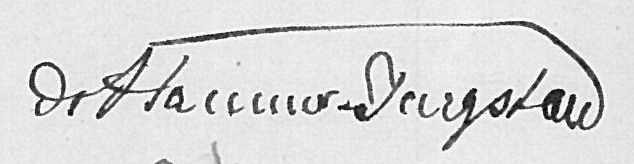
DrHammer-Purgstall
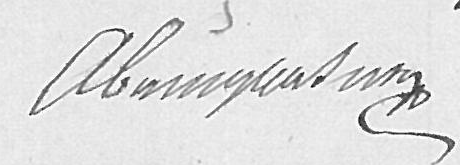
ABaumgartner
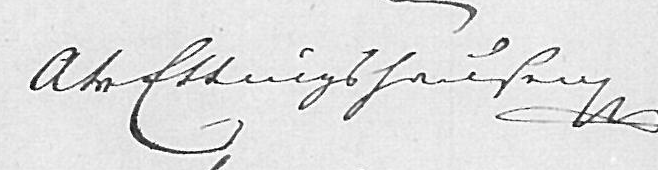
AvEttingshausen
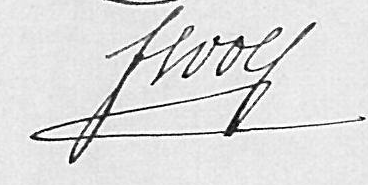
FWolf
